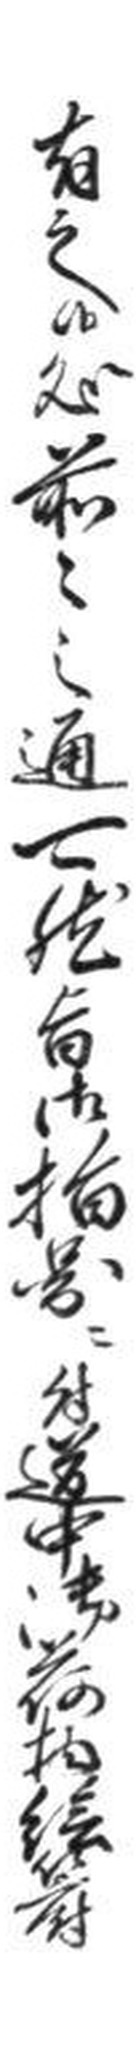有之候処前々之通可然旨御指図ニ付道中御荷物絵符
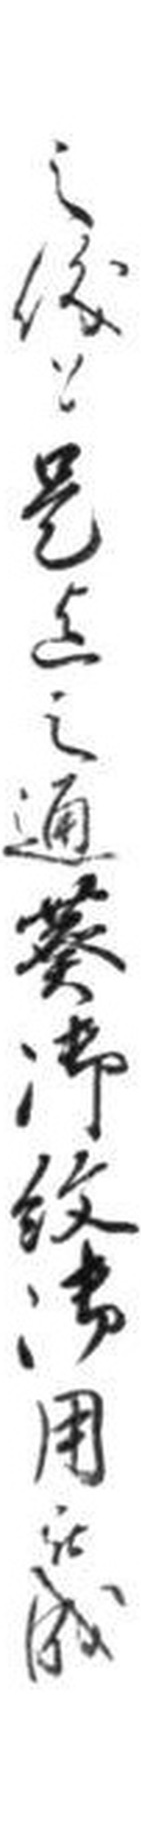之儀も是迄之通葵御紋御用被成
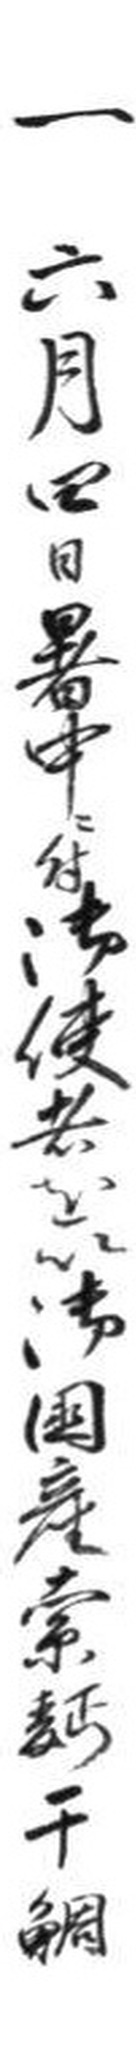一六月四日暑中ニ付御使者を以御国産素麵干鯛
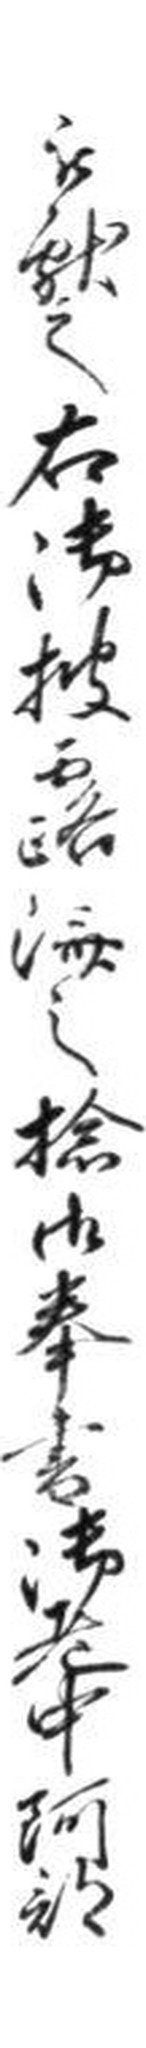被献之右御披露済之捻御奉書御老中阿部
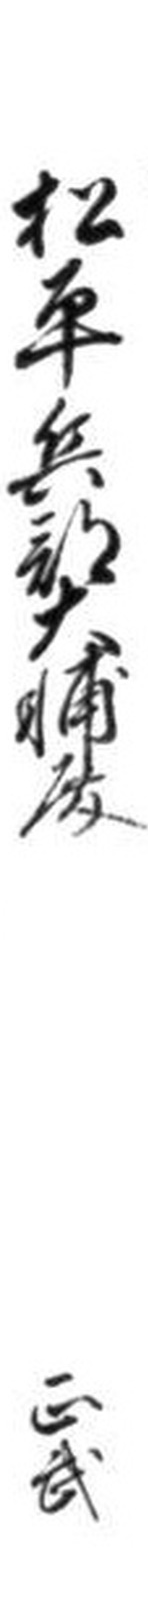松平兵部大輔殿正武
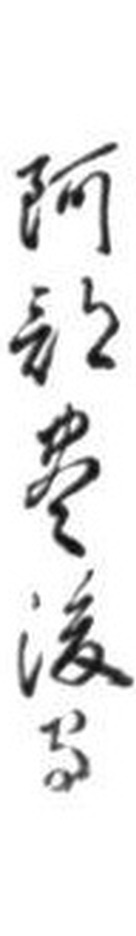阿部豊後守
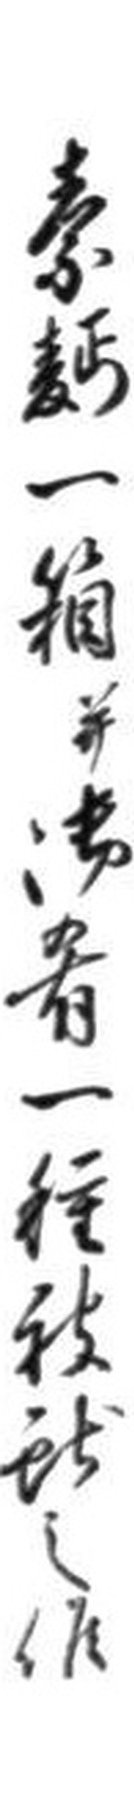素麵一箱并御肴一種被献之作
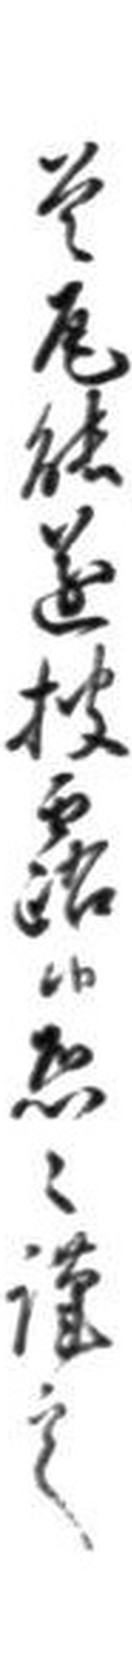首尾能遂披露候恐々謹言
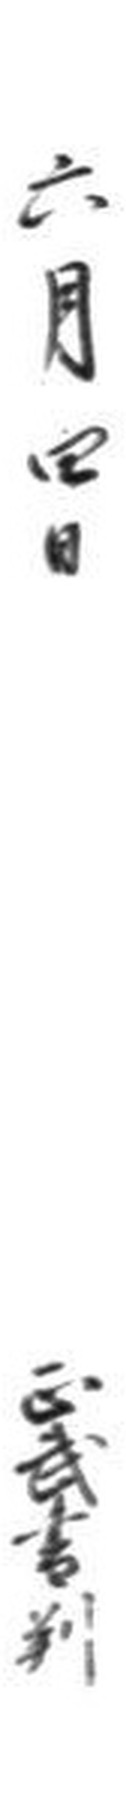六月四日正武書判
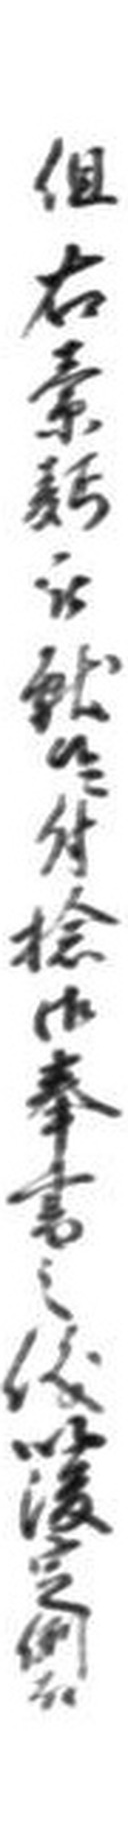但右素麵被献候ニ付捻御奉書之儀以後定例故
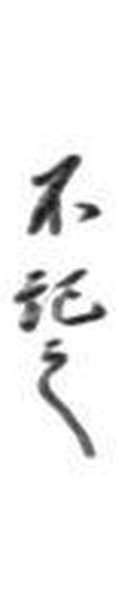不記之
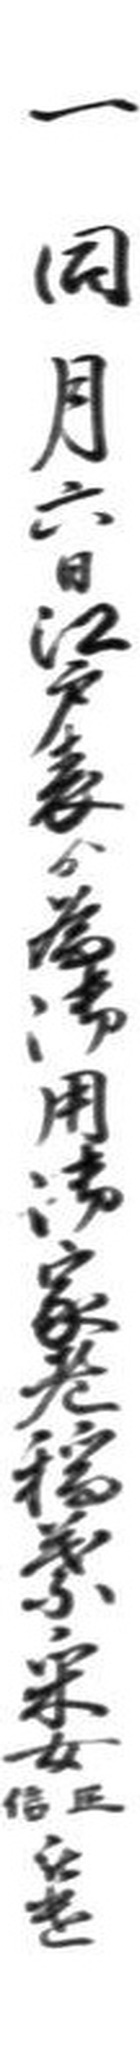一同月六日江戸表ゟ為御用御家老稲葉采女正信被遣

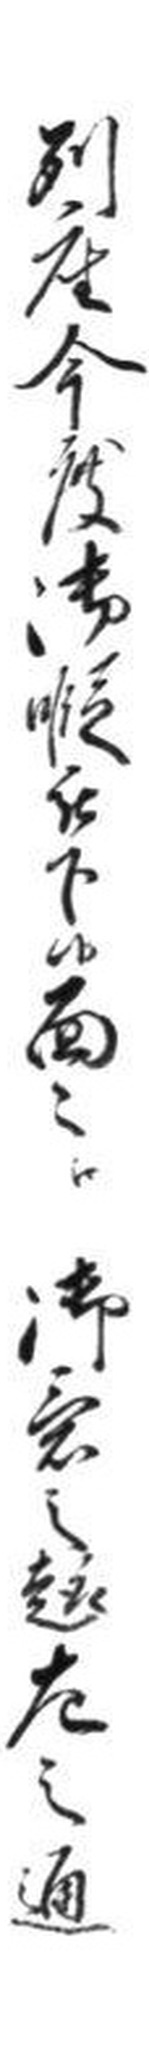列座今度御暇被下候面々江御意之趣左之通
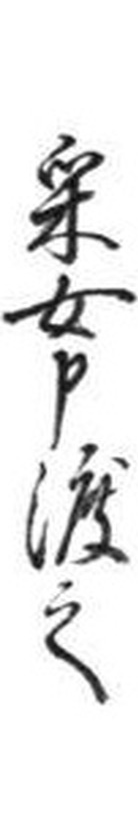采女申渡之
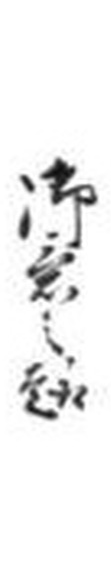御意之趣
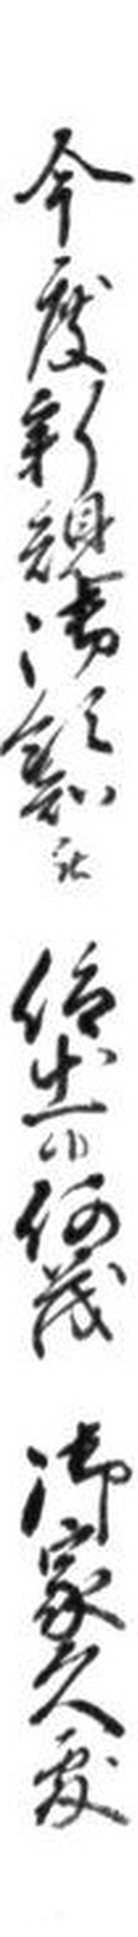今度新規御領知被仰出候何茂御家久敷
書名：家譜 十六 吉品公 従貞享三年閏三月到同四年
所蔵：福井県文書館 Fukui Prefectural Archives
